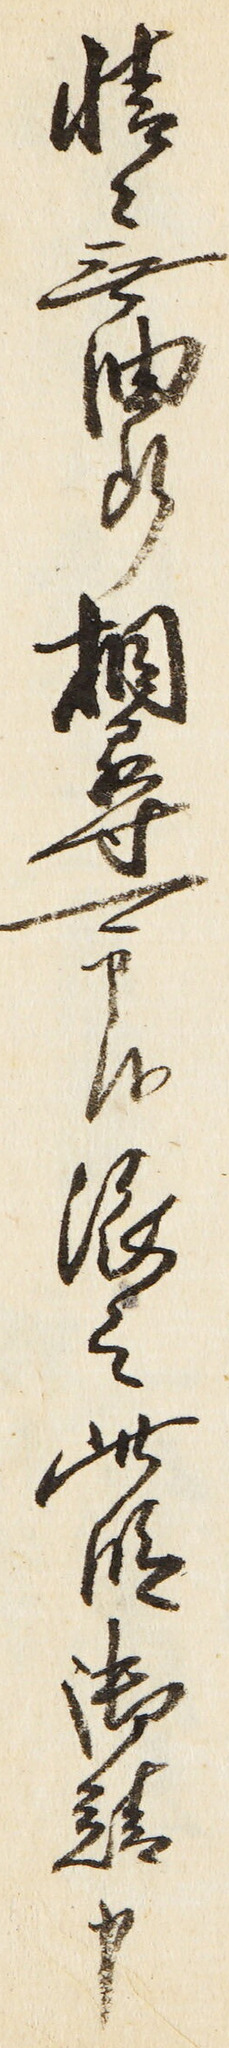情々無油断相尋可申候依之此段御請申
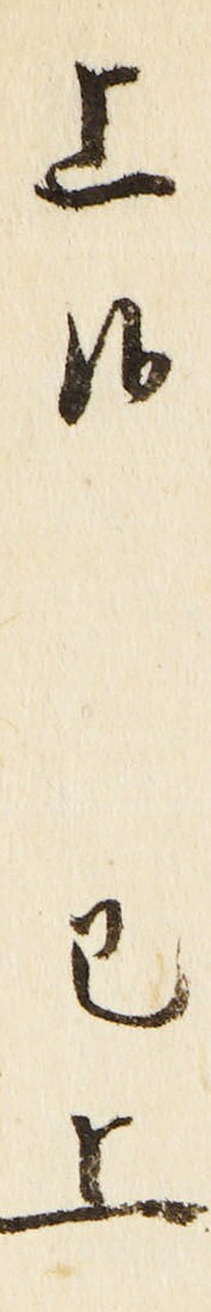上候已上

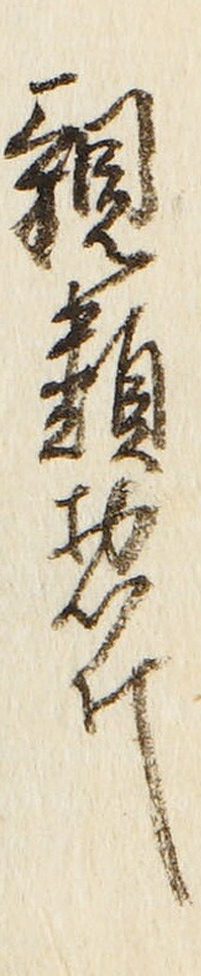親類惣代
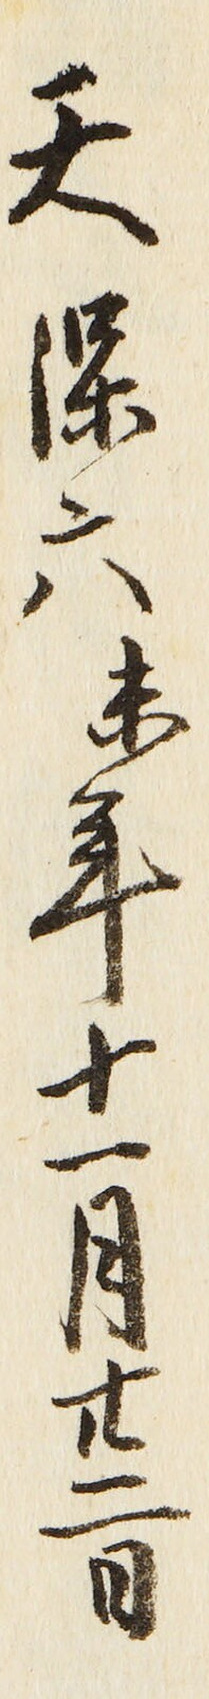天保六未年十一月廿二日
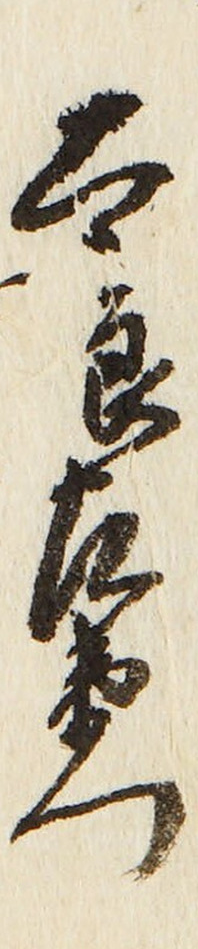太郎左衛門
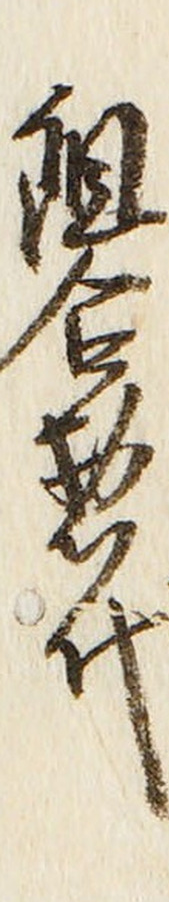組合惣代
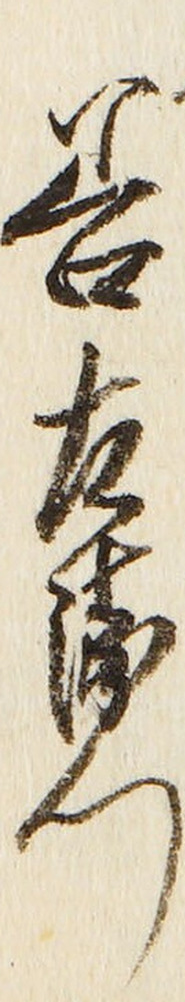善左衛門
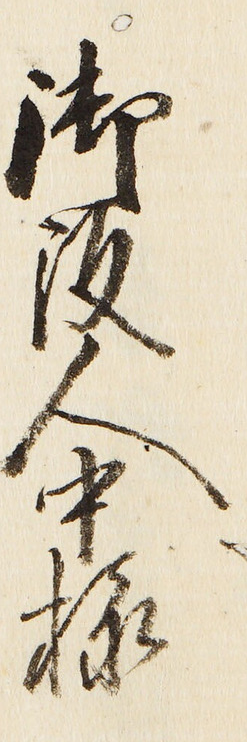御役人中様
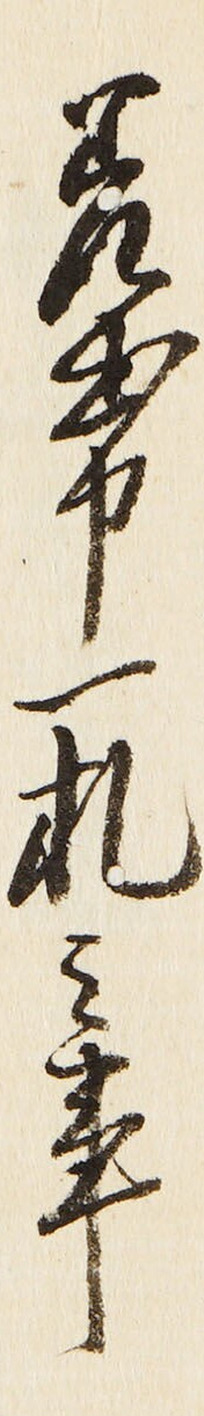差出申一札之事
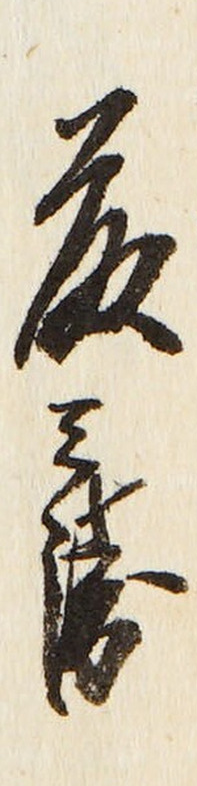藤兵衛
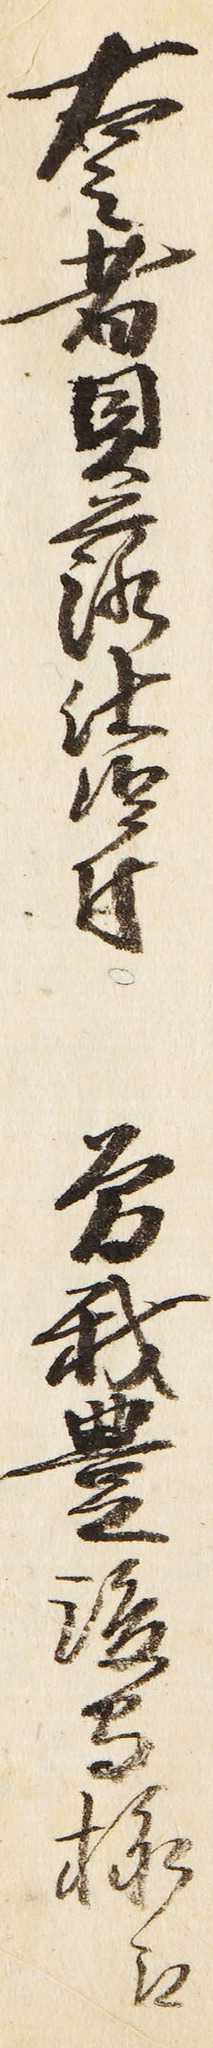右之者貝落仕候ニ付曽我豊後守様江
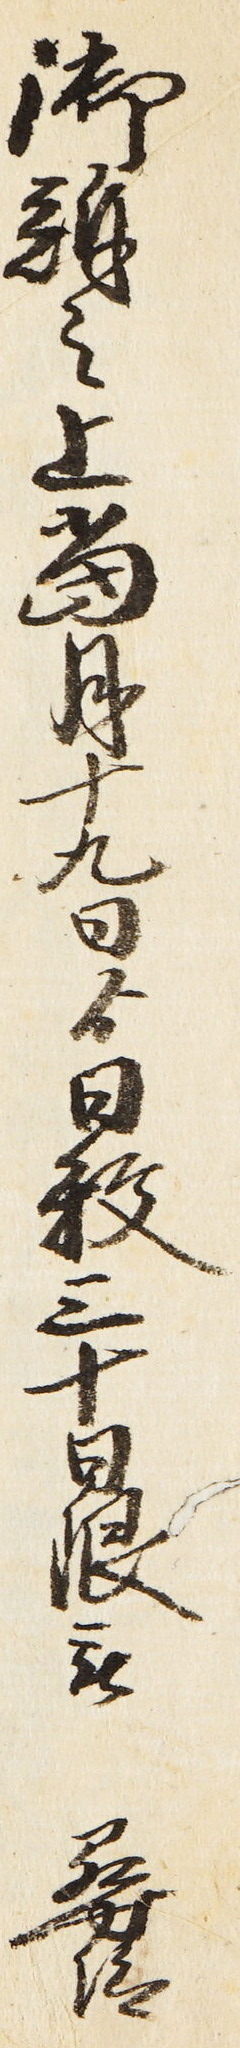御訴之上当月十九日ゟ日数三十日限被尋仰
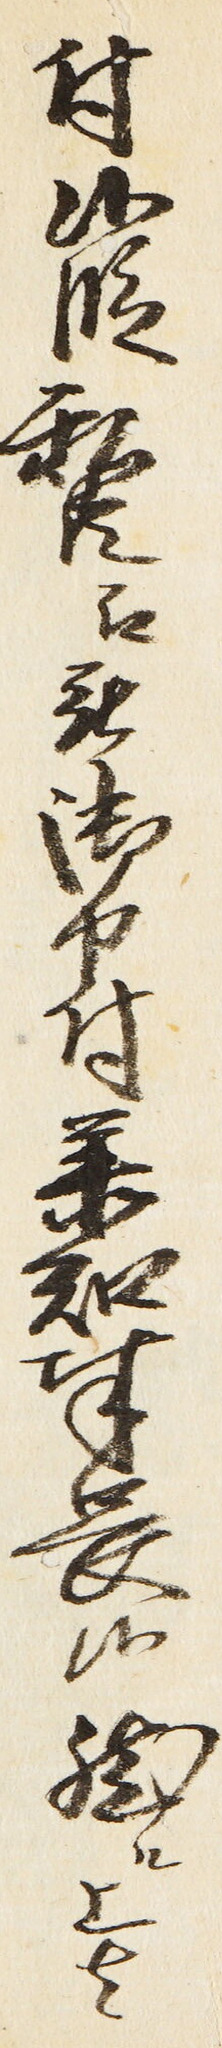付候段私共江被御申付承知奉畏候然ル上者
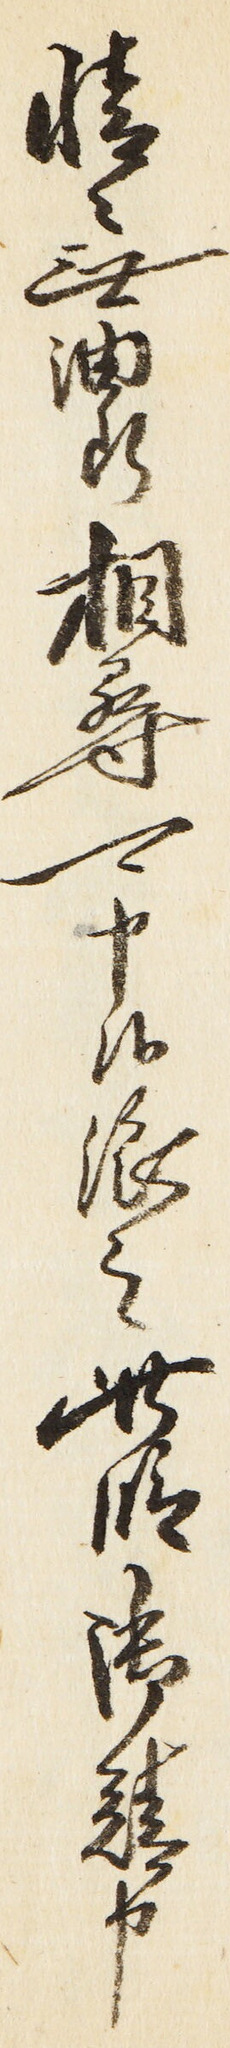情々無油断相尋可申候依之此段御請申
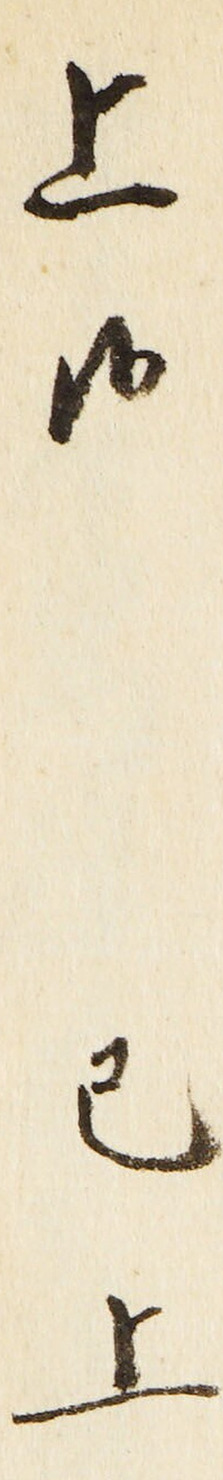上候已上

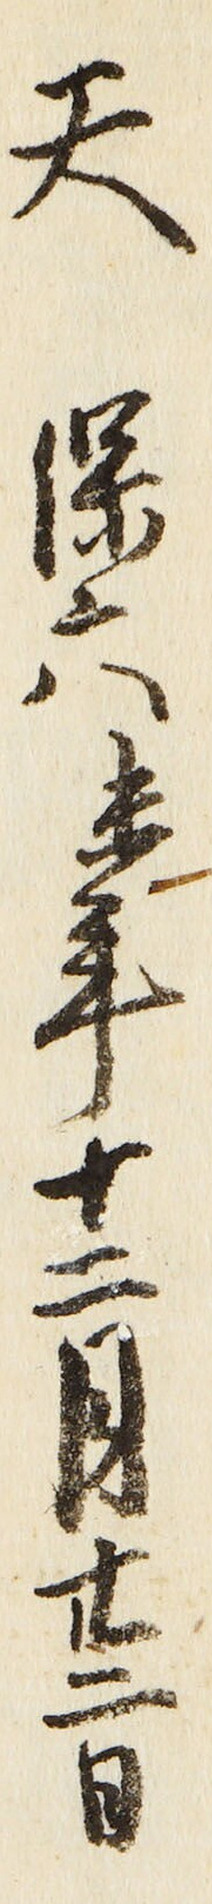天保六未年十二月廿二日
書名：難船一件記録
